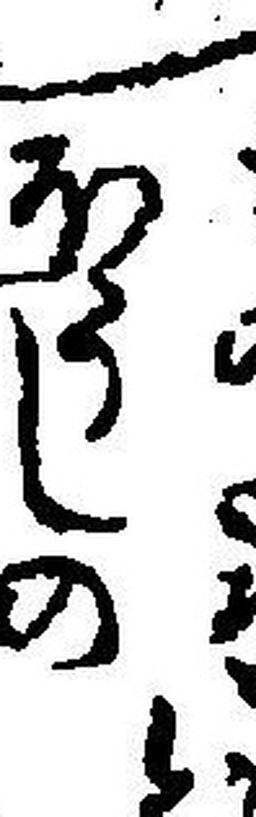ほうしの
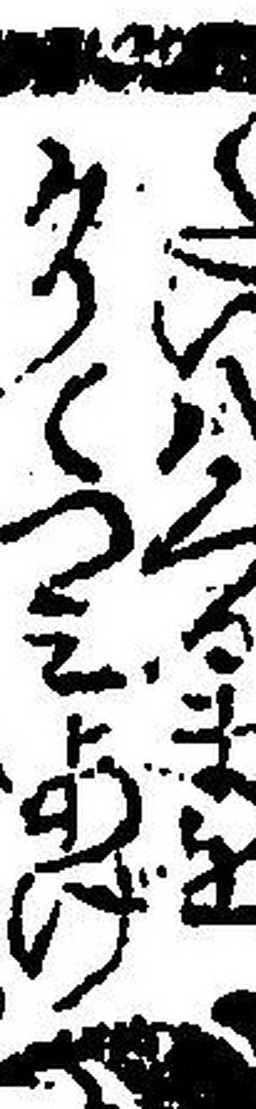かりてつみあげ
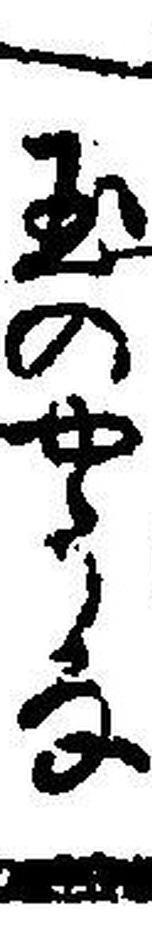玉のやうな
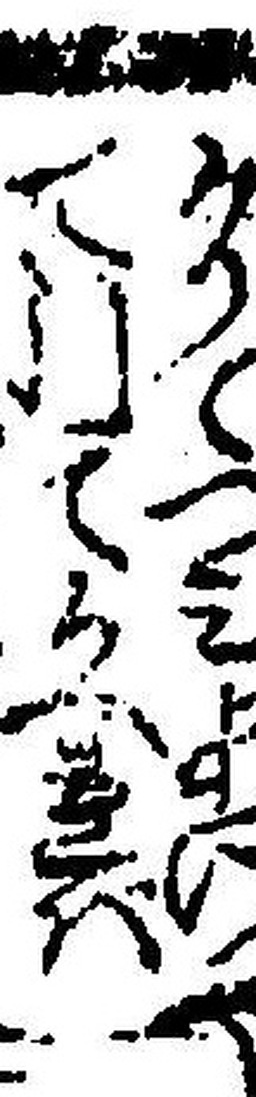て引てかへれば
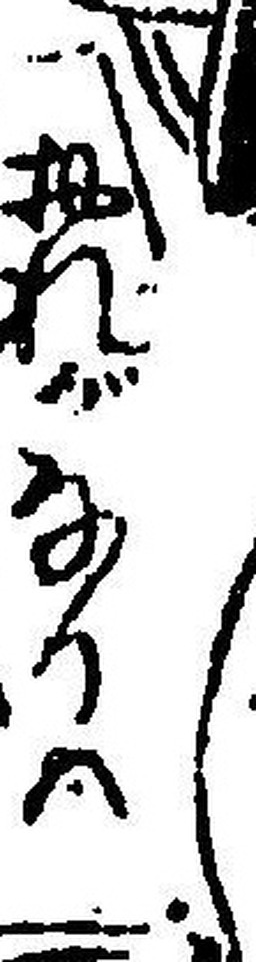〽おれがなりは
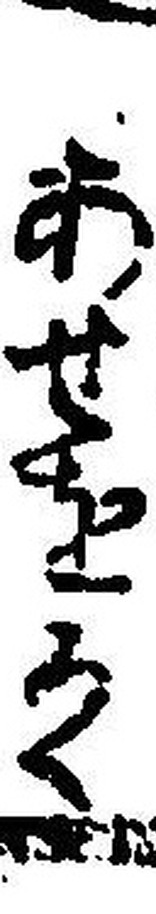あせをかく
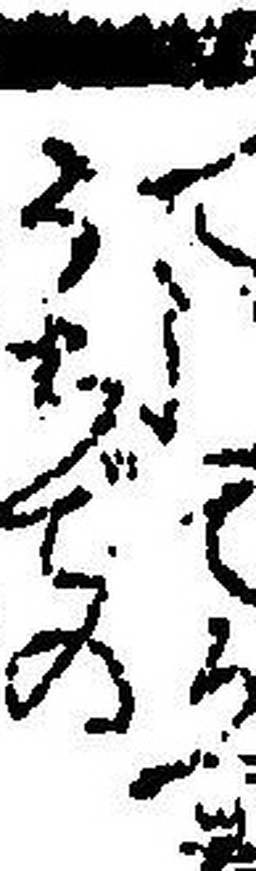うちでの
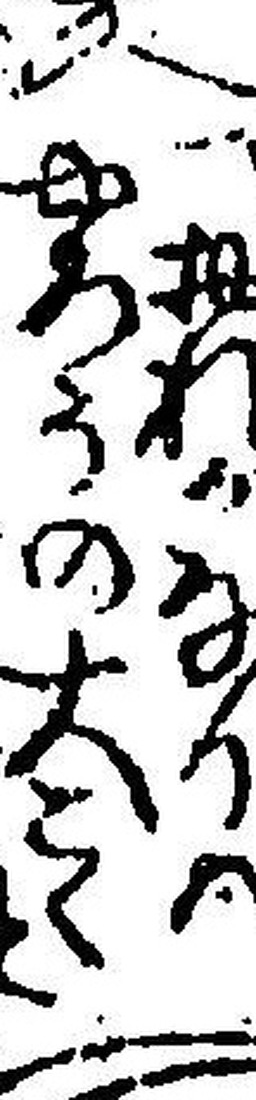やろうの大こくと
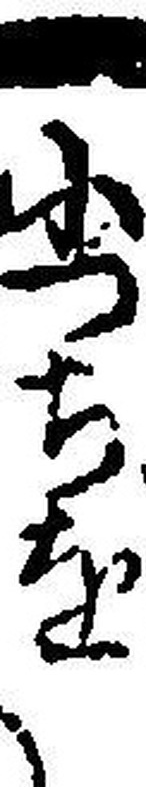小つちを
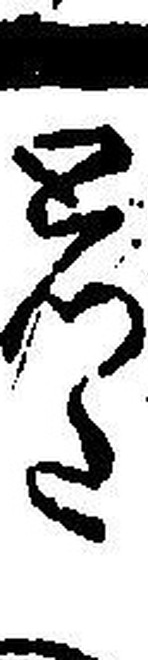とつた
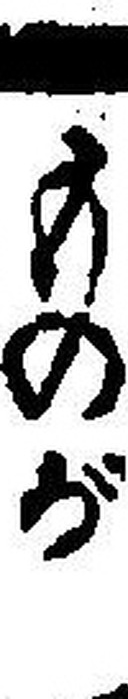ものが
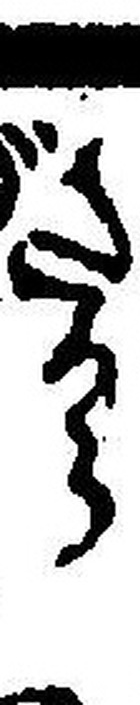たから
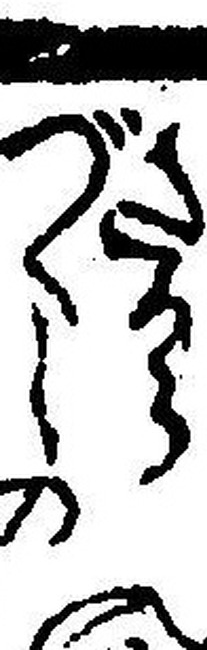づくしの
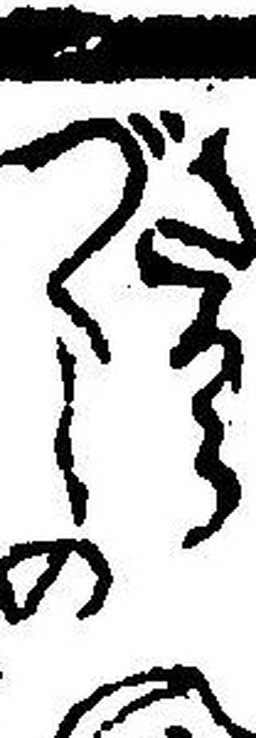づくしの
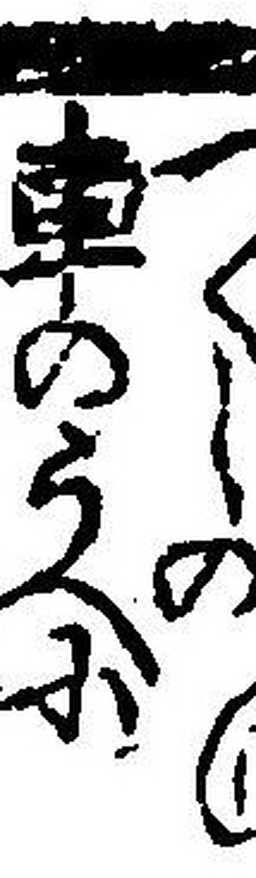車のうへに
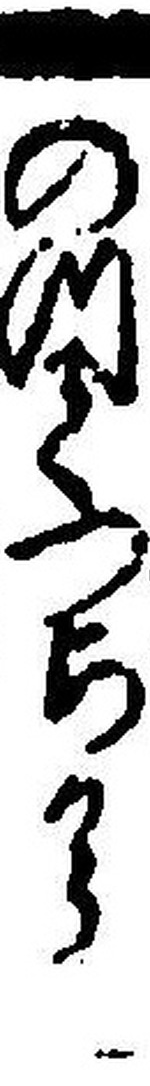のつてつちから
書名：徳若水縁起金性 / 樹下石上作
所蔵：東京大学総合図書館 General Library in the University of Tokyo, JAPAN
